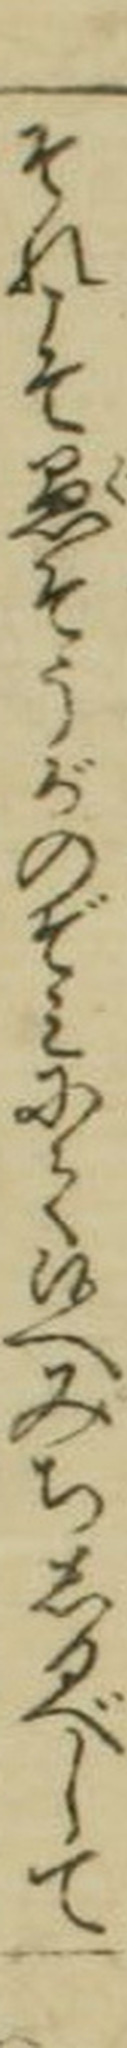それこそ愚そうがのぞみにて候へ。みちしるべして
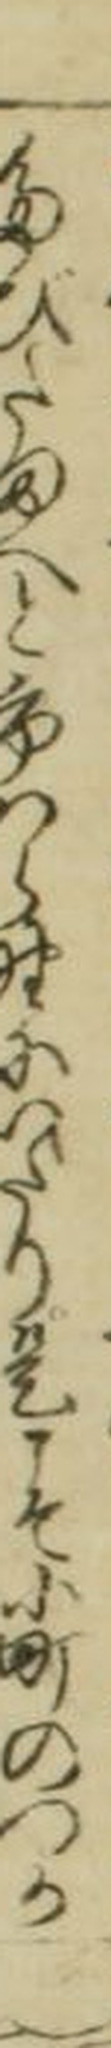たびたまへと市はら野にいたり。是こそ小町のつか
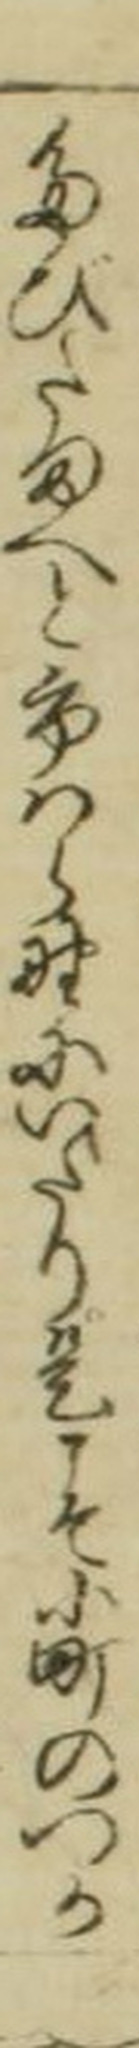たびたまへと市はら野にいたり。是こそ小町のつか
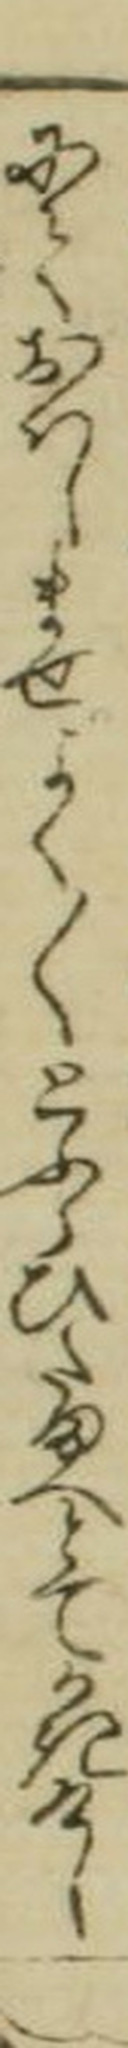にておはしませ。よく〳〵とふらひたまへとてかきけし
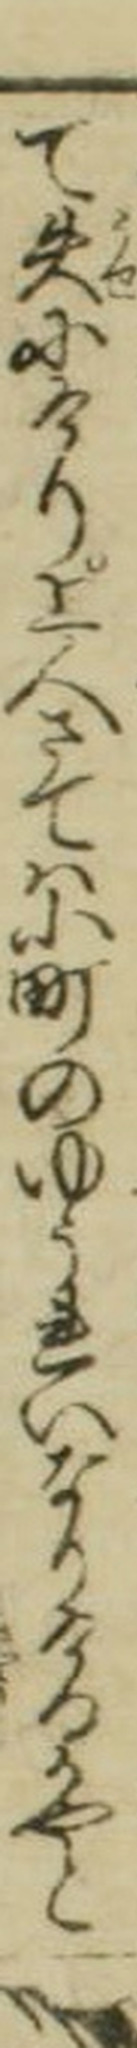て失にけり。上人さては小町のゆうれいなりけるかやと
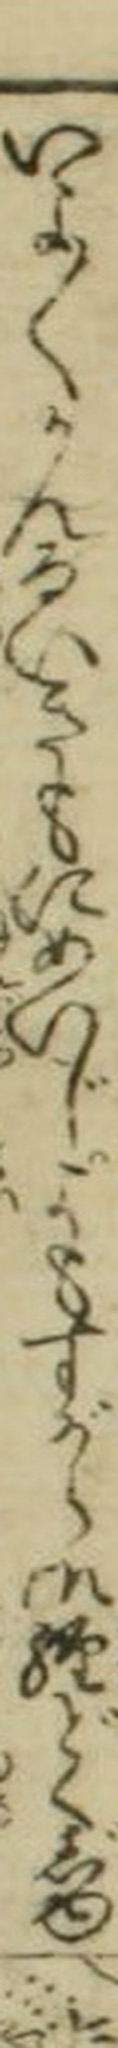いよ〳〵かんるいきもにめいじ。よもすがら御経どくじゆ
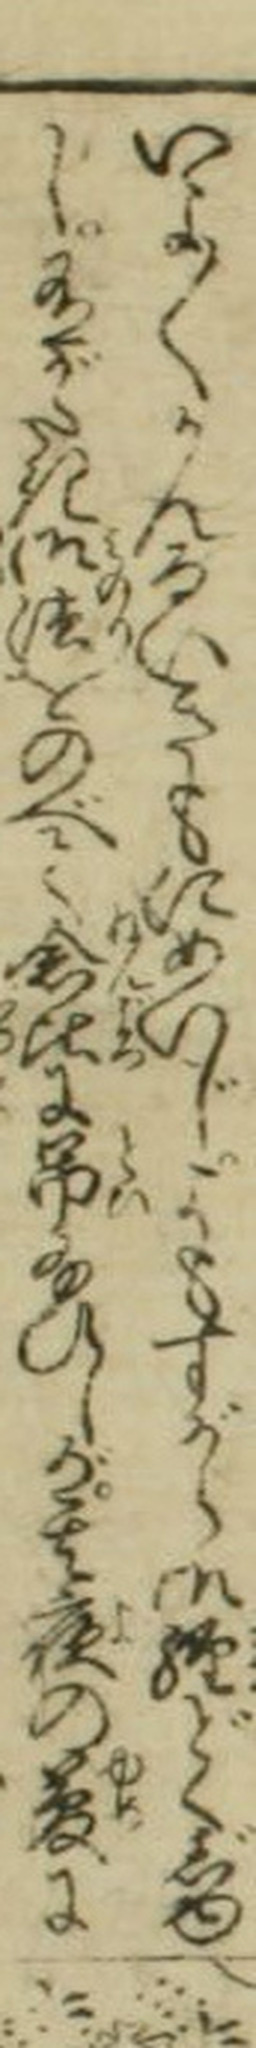し。有がたき御法をのべて念比に弔給ひしが。其夜の夢に
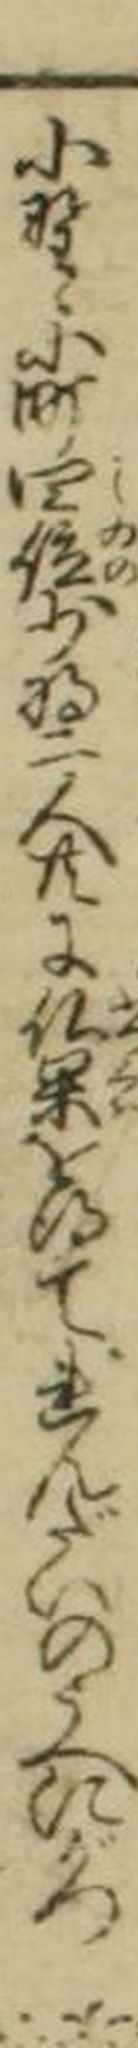小野ゝ小町四位少将二人共に仏果を得てれんだいのうへにがつ
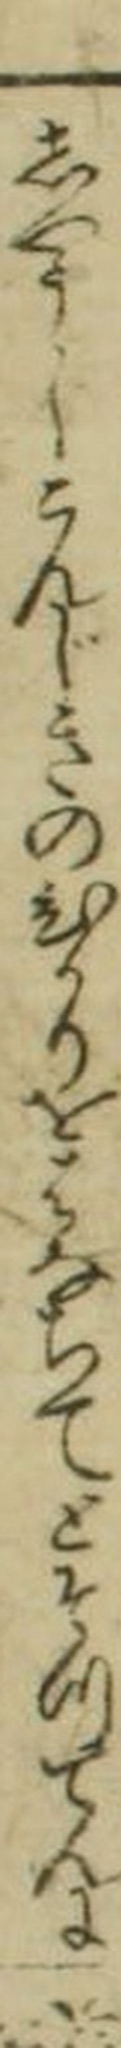しやうしこんじきのひかりをはなちてとそつてんに
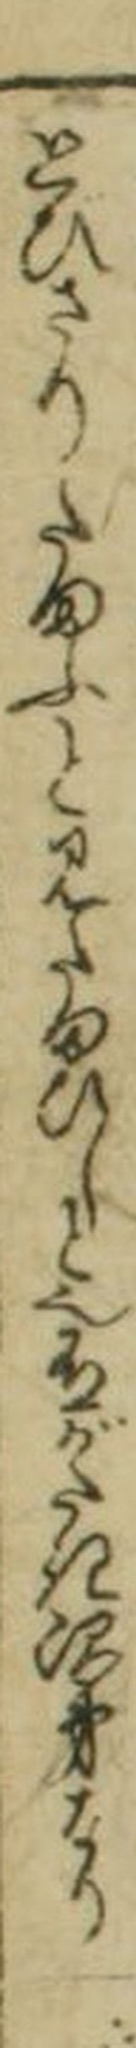とびさりたまふと見たまひしと也有がたき次第なり

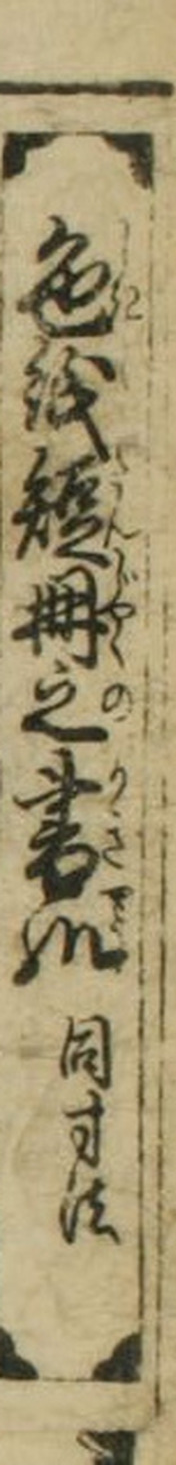色紙短冊之書様同寸法
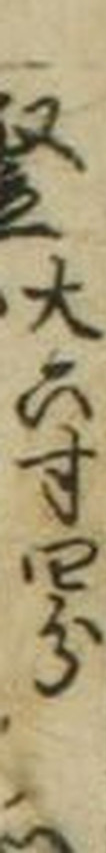竪大六寸四分
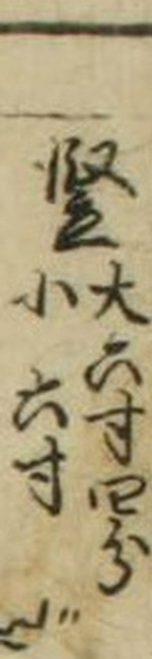竪大六寸四分
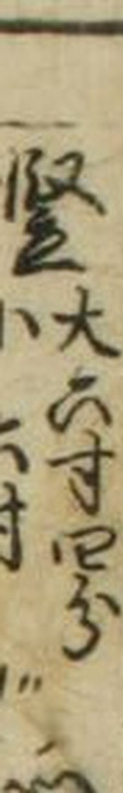竪大六寸四分
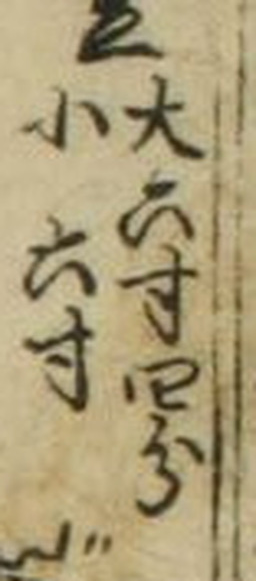小六寸
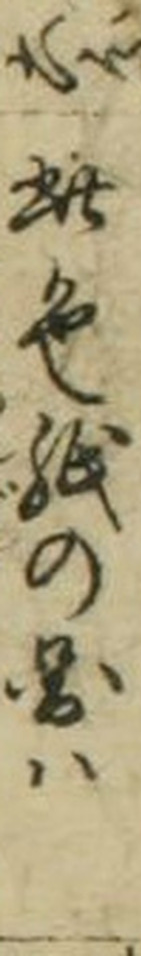此色紙の図は
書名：女源氏教訓鑑
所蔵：東京学芸大学附属図書館
